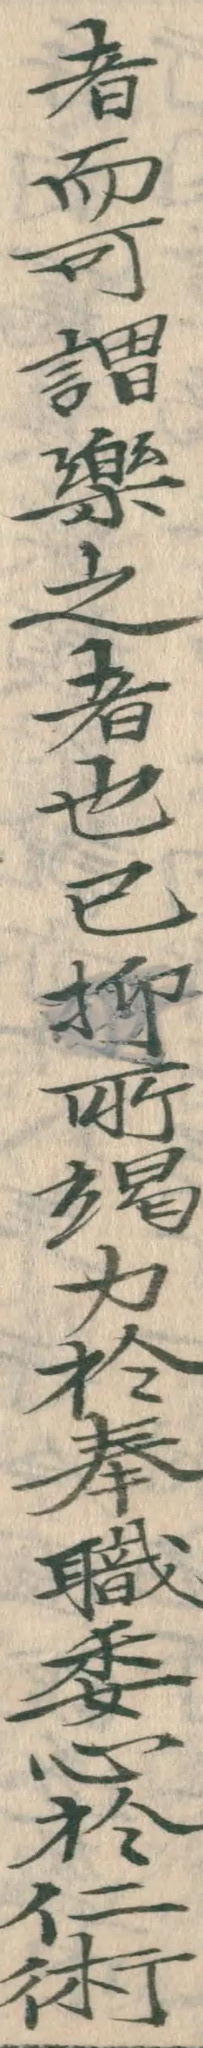者而可謂樂之者也已抑所竭力於奉職委心於仁術
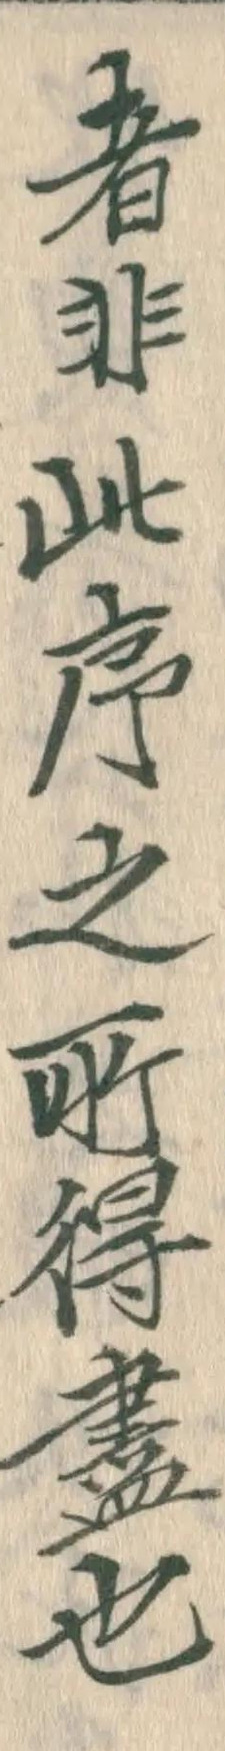者非此序之所得盡也
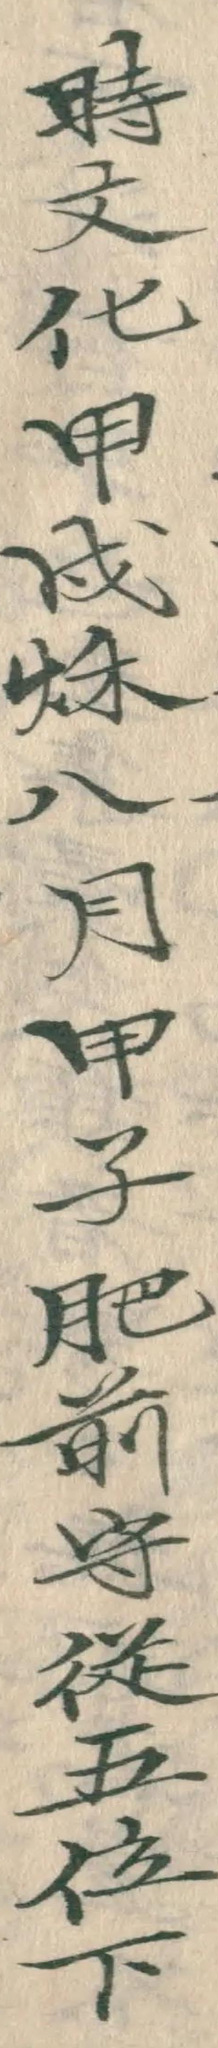時文化甲戌秌八月甲子肥前守従五位下
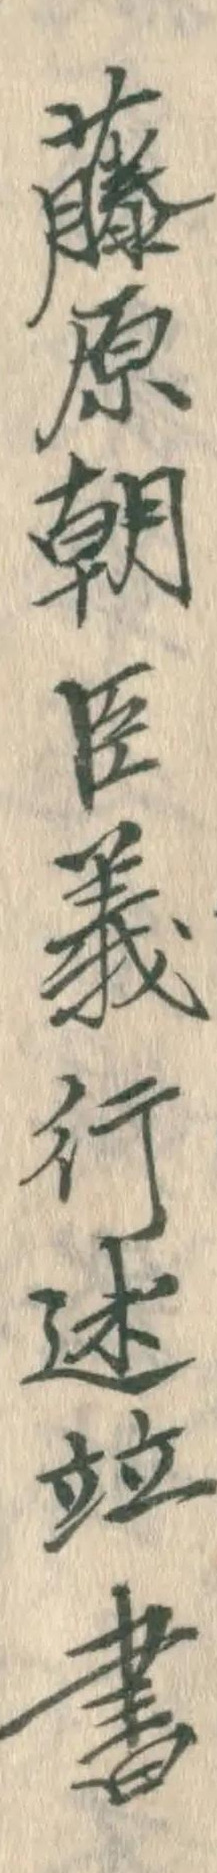藤原朝臣義行述竝書

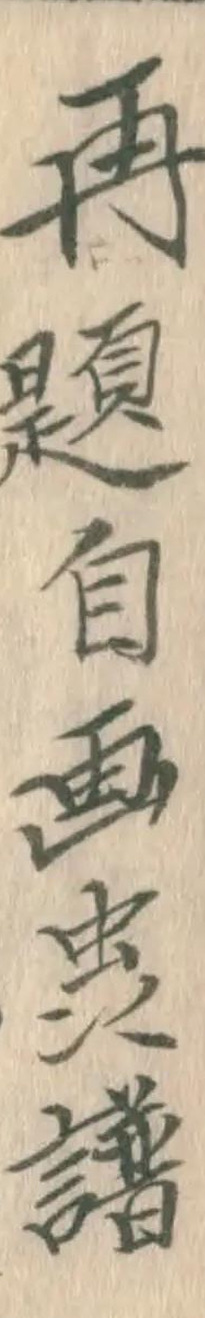再題自画蟲譜
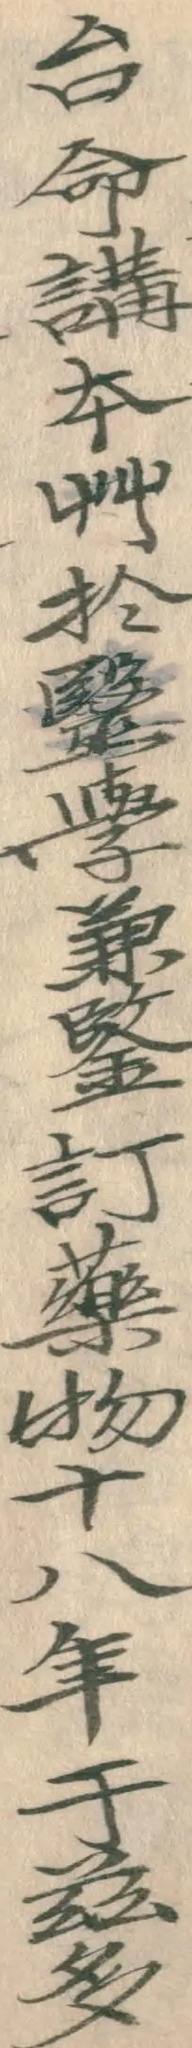台命講本艸於毉學兼鍳訂藥物十八年于茲多
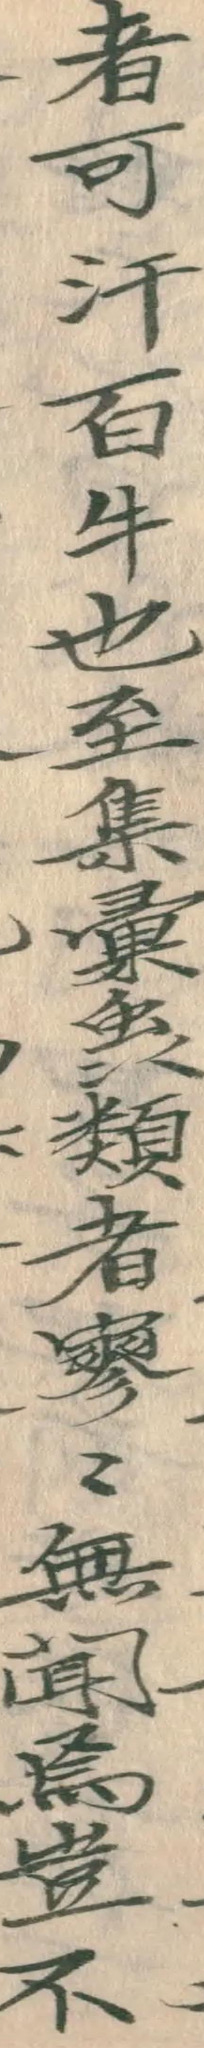者可汗百牛也至集彙蟲類者寥々無聞焉豈不
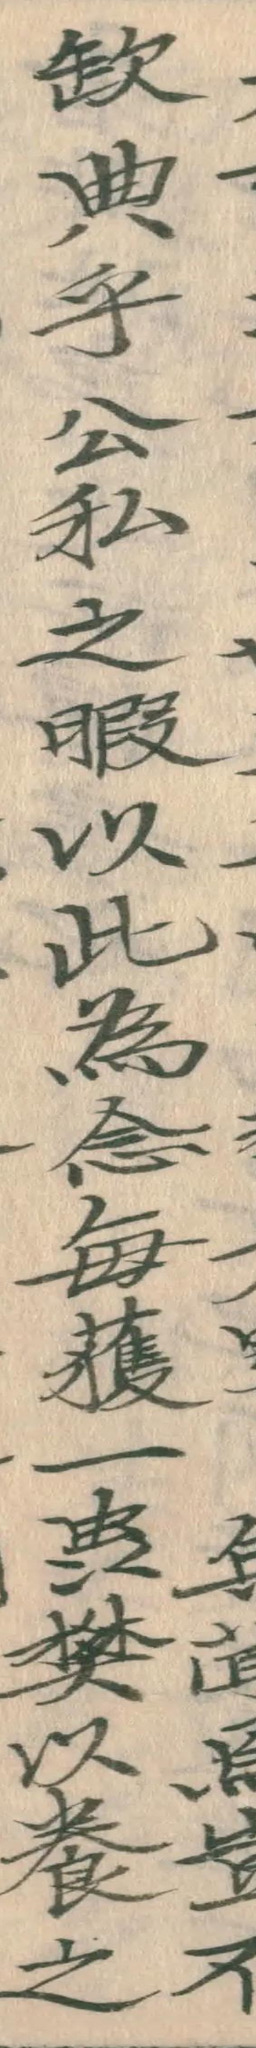缼典乎公私之暇以此為念毎獲一蟲樊以養之
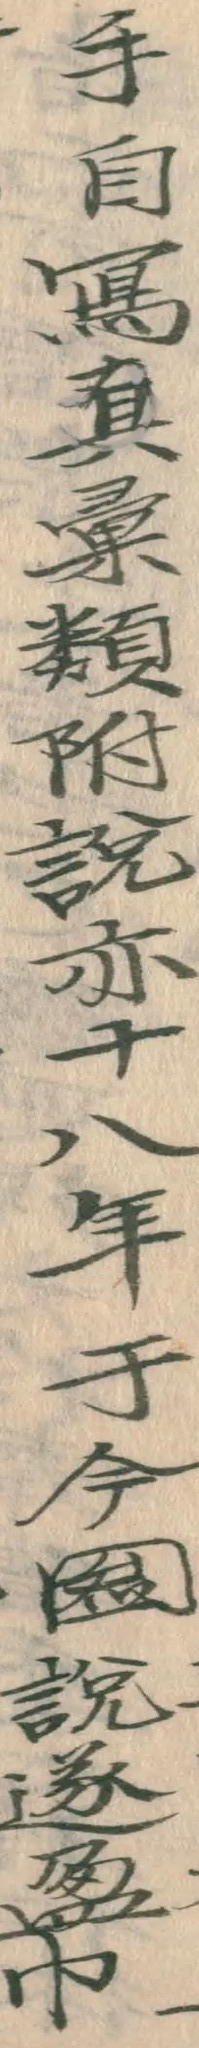手自冩真彙類附説亦十八年于今圖説遂盈巾
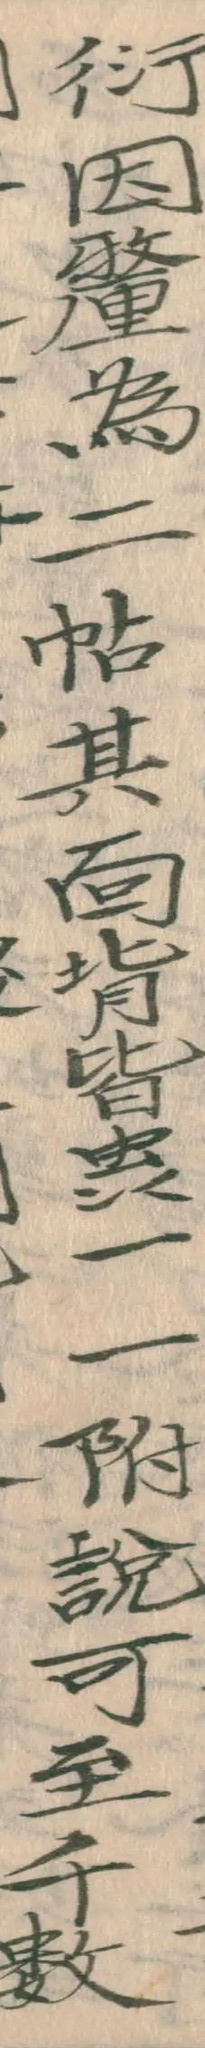衍因𨤲為二帖其靣背皆蟲一一附説可至千數
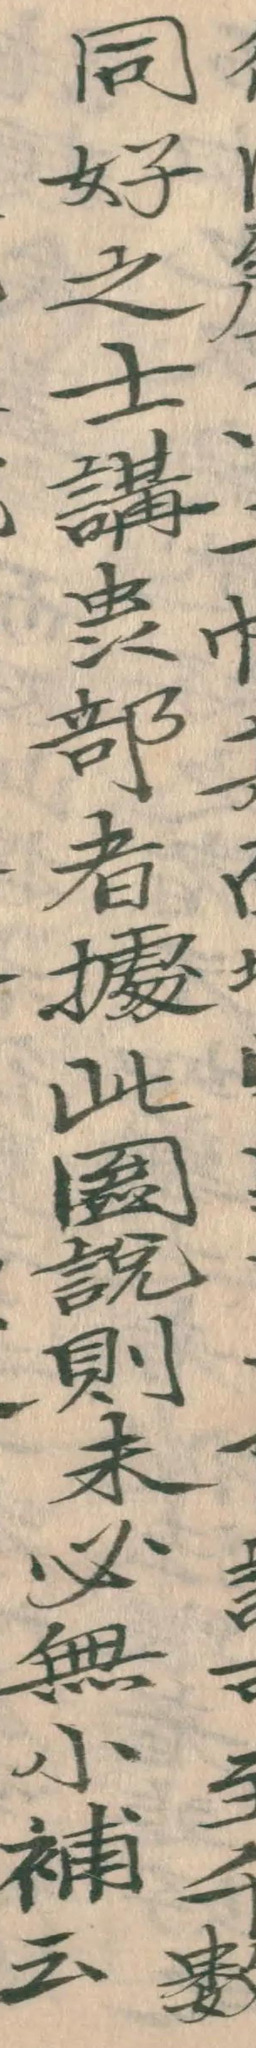同好之士講蟲部者據此圖説則未必無小補云
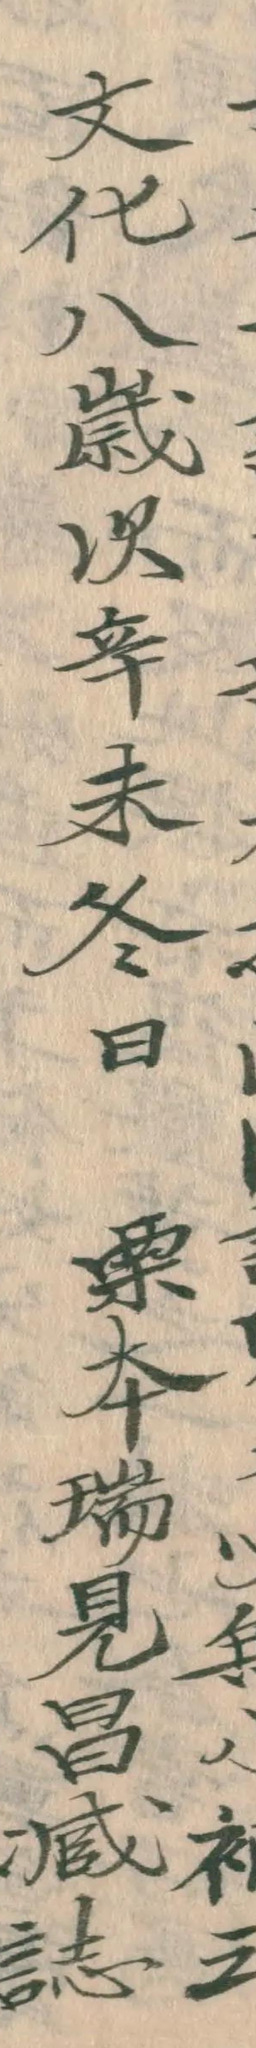文化八歳次辛未冬日栗本瑞見昌臧誌
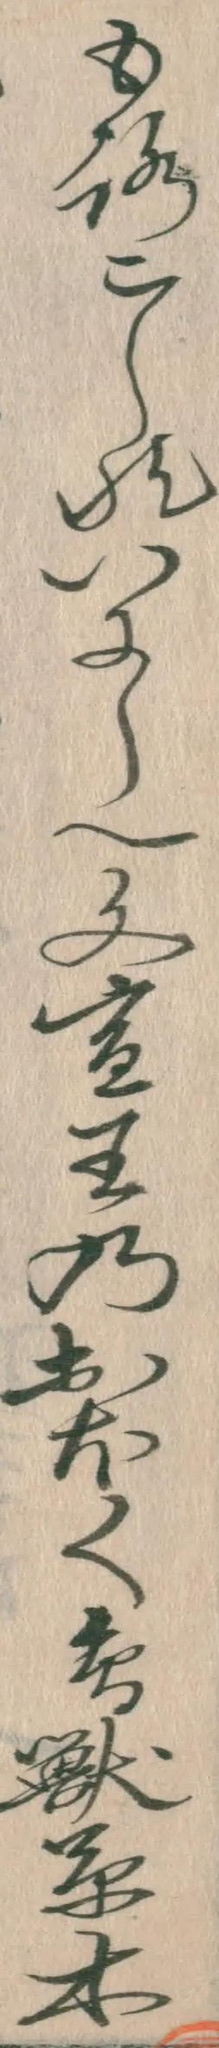もろこしのいにしへ文宣王のおほく鳥獣草木
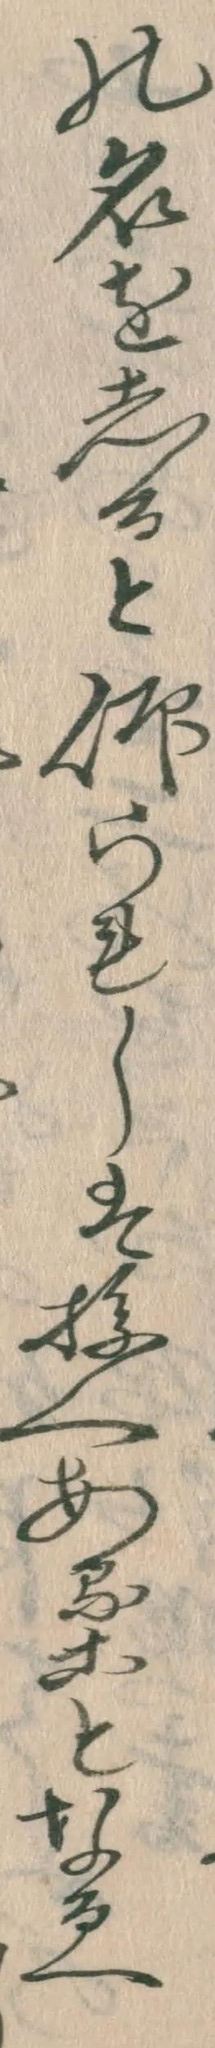の名をしると仰られしはへあることなるへし
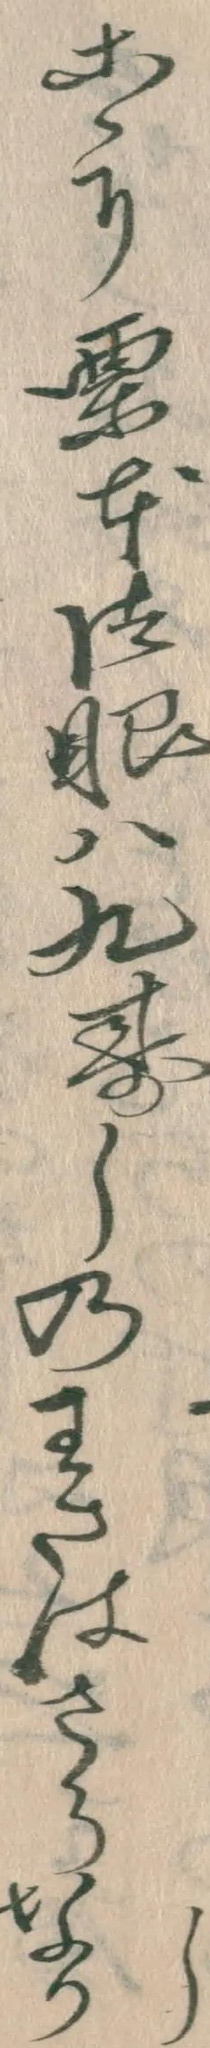こゝに栗本法眼はくすしのわさはさらなり
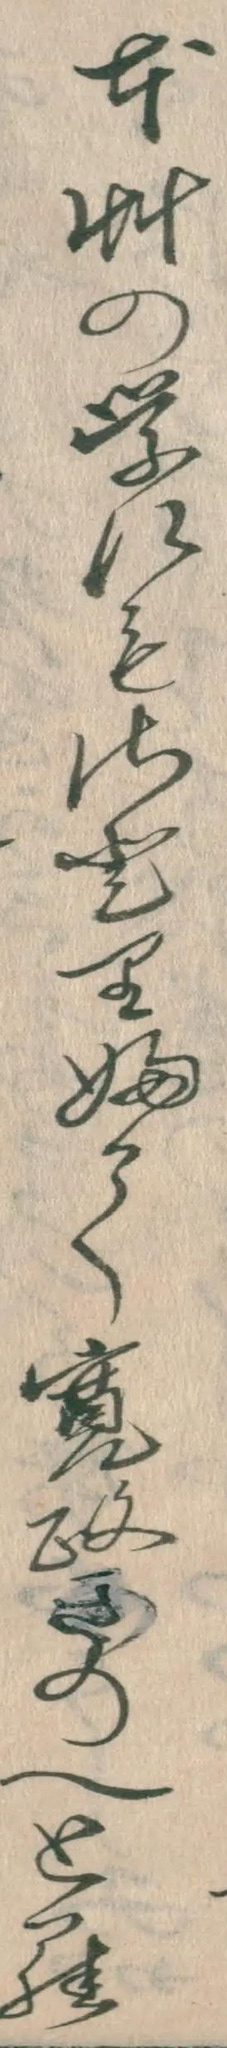本艸の学にもさとりふかく寛政きのへとら
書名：千蟲譜 3巻. [1]
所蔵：国立国会図書館 National Diet Library, JAPAN
